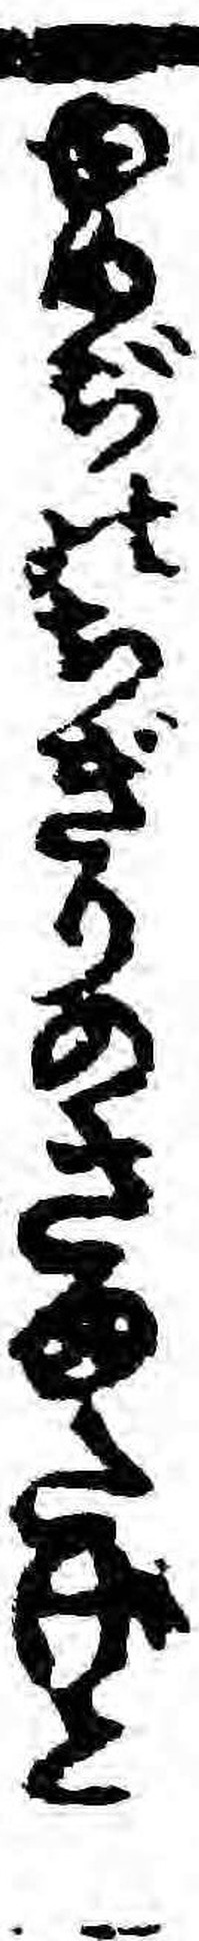ゆめぢのちぎりのさまたげと
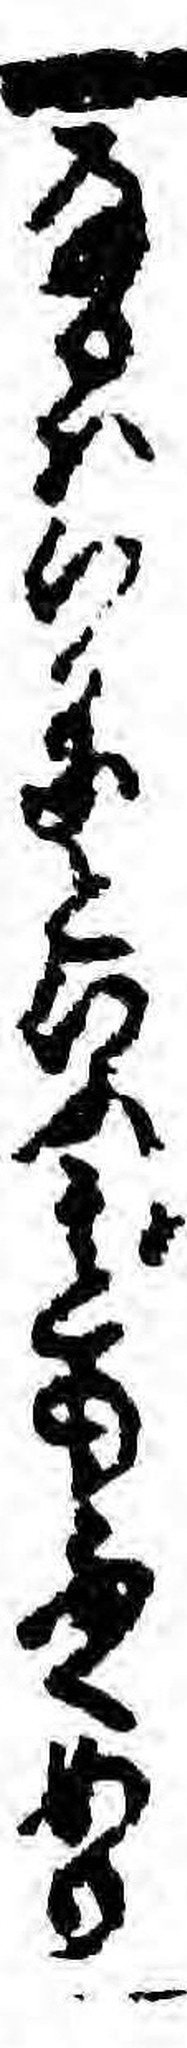なるはいかにといふ意もふくめり
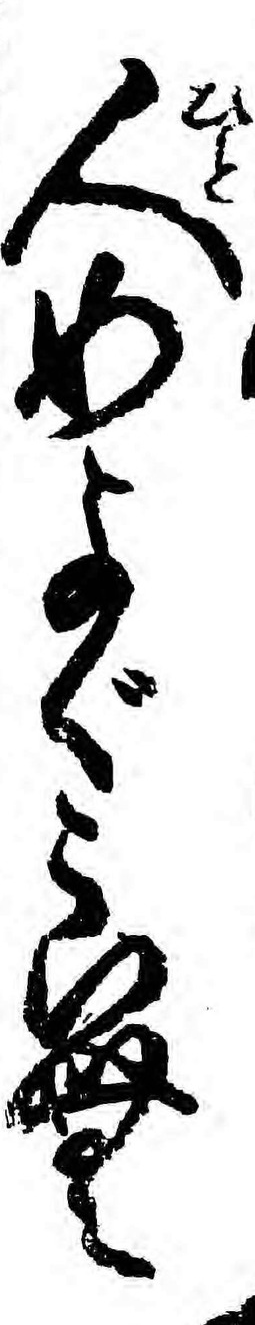人めよぐらむ
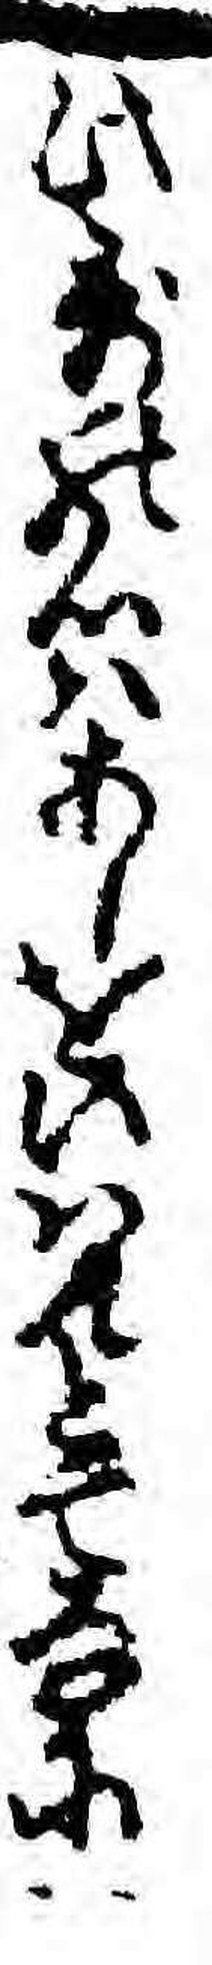此哥の心はあしをいはんとてなに
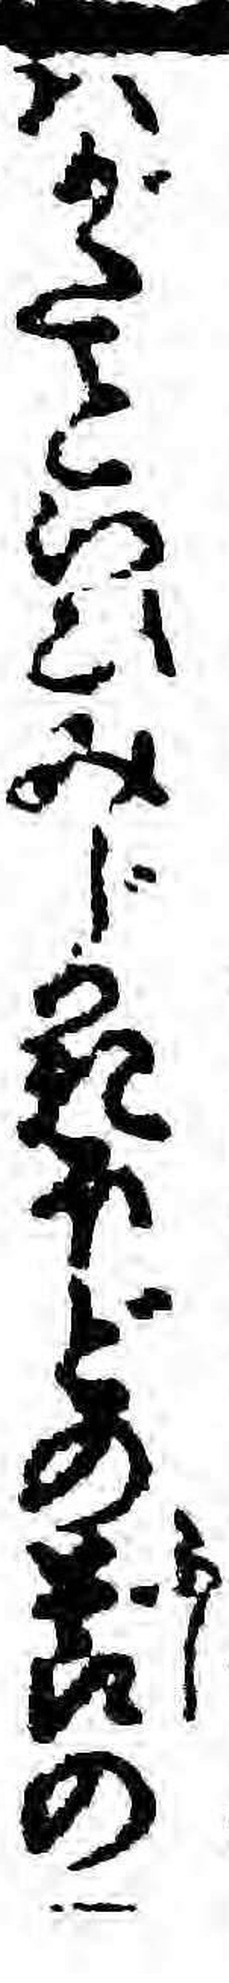はがたといひみじかきほどの節の
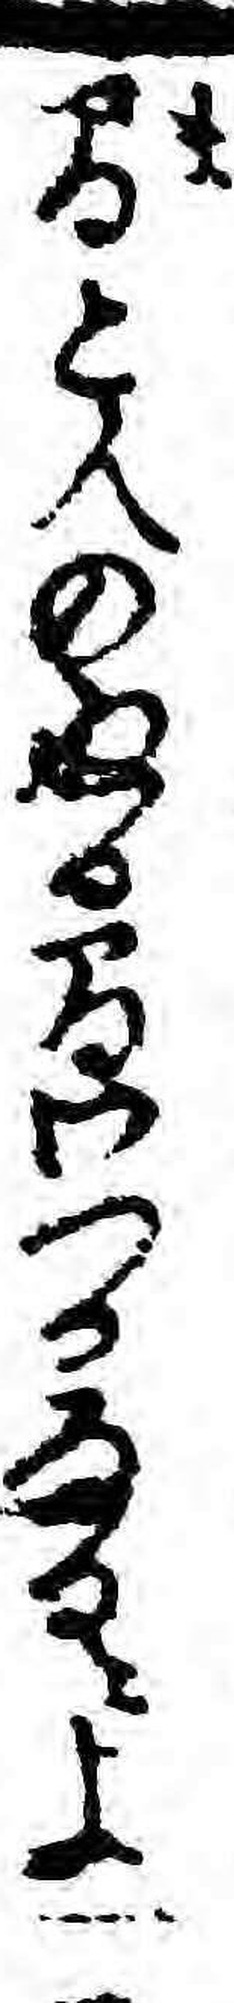間と人のぬる間わつかなるによ
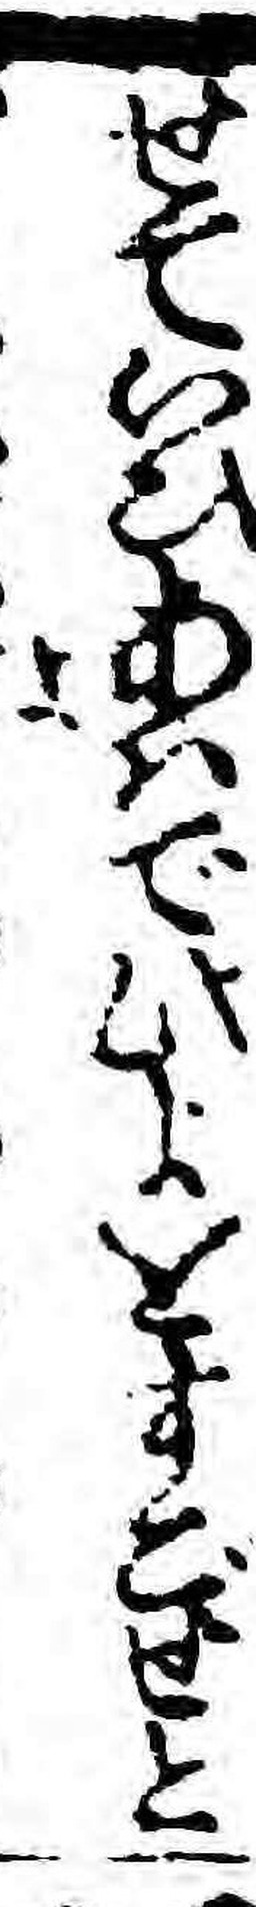せていひあはで此よをすごせと
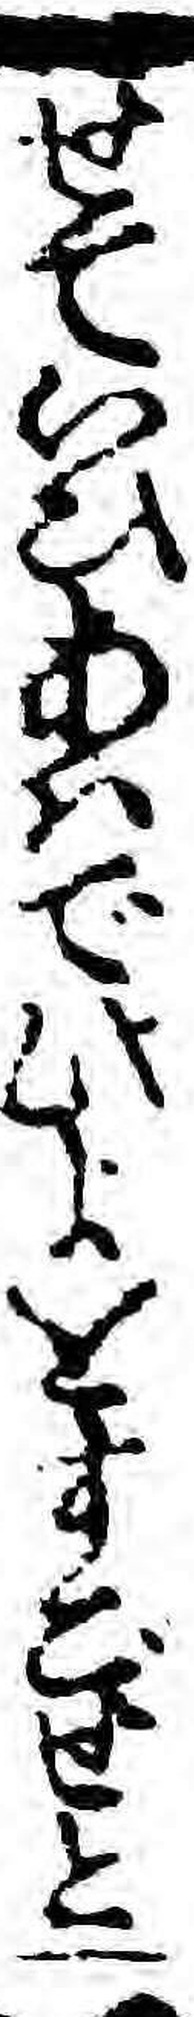せていひあはで此よをすごせと
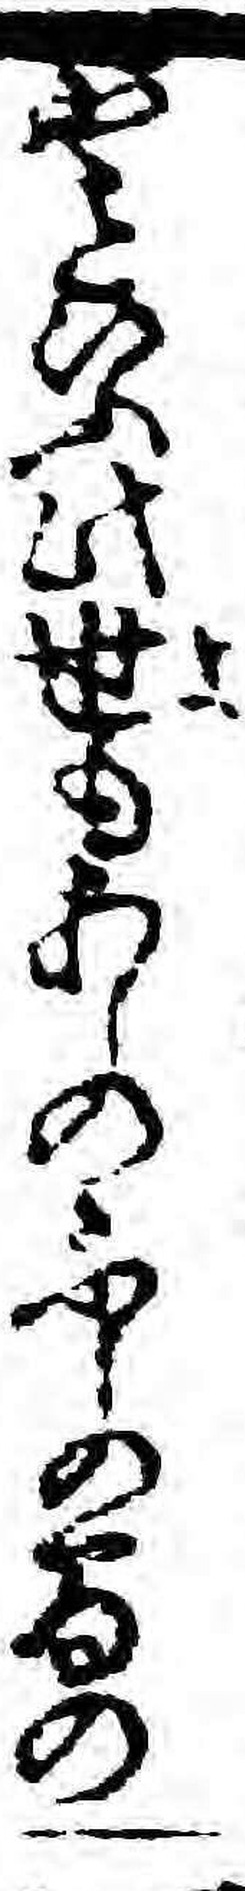やといふ此世もあしのふしの間の
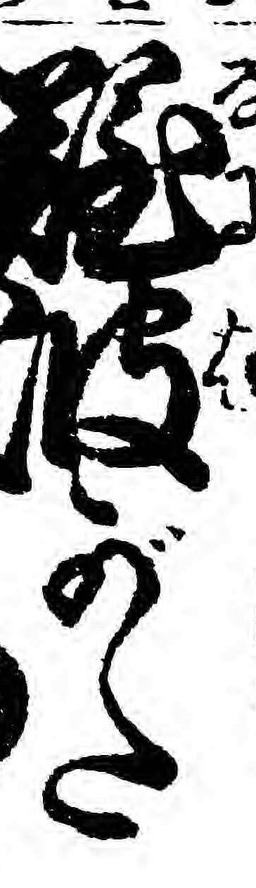難波がた
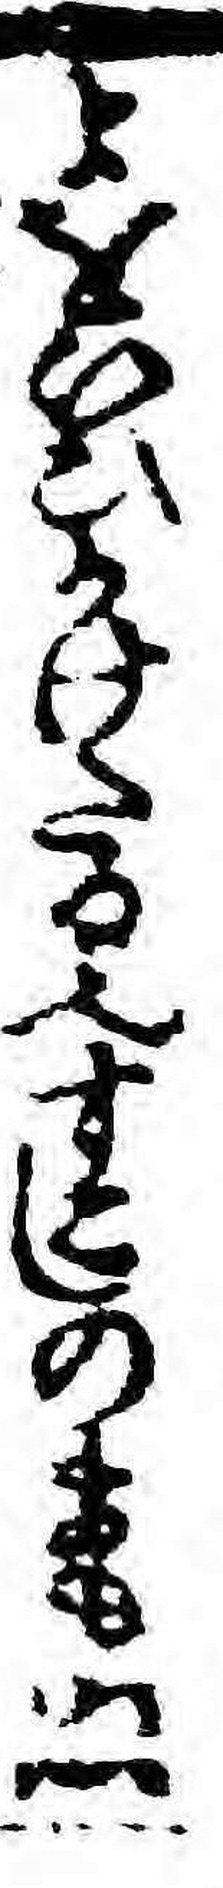よをいひかけるたる也すこしのまもぬ
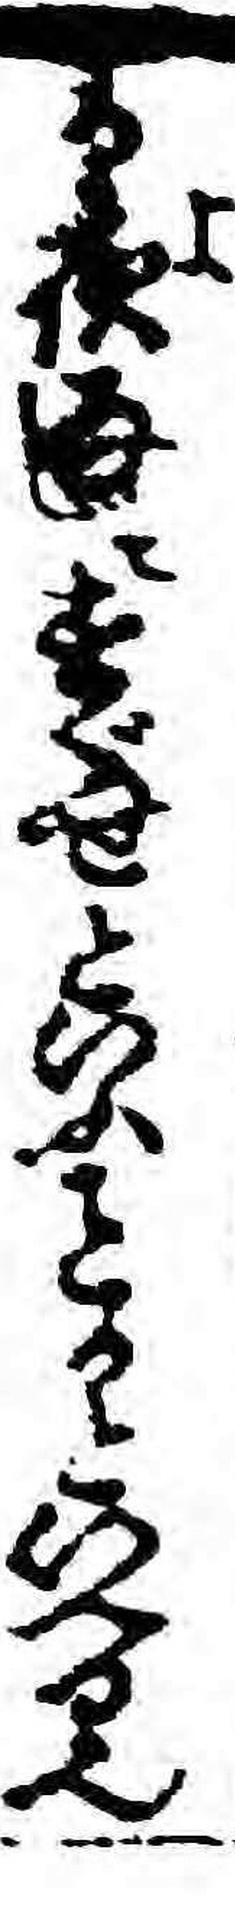る夜なしにすぐせといふことかといへる也
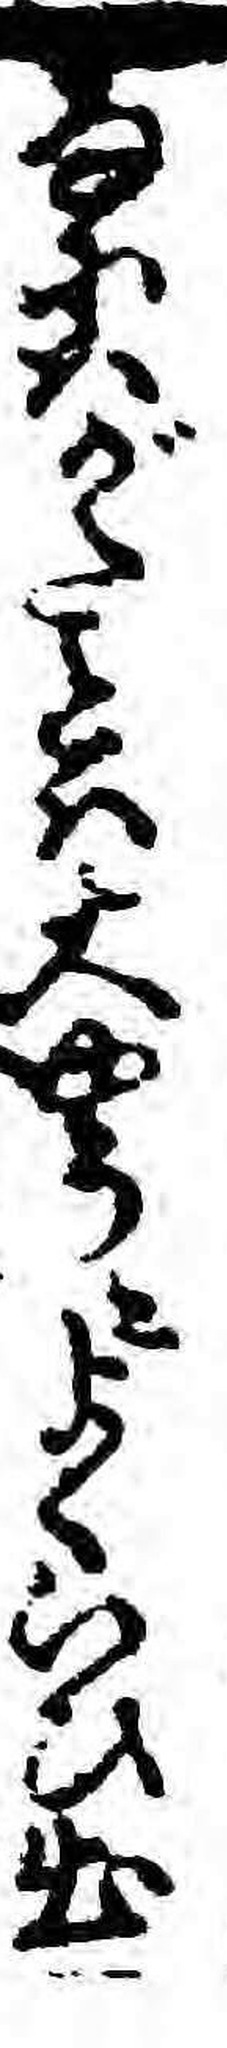なにはかたとは大やうによくいひ出
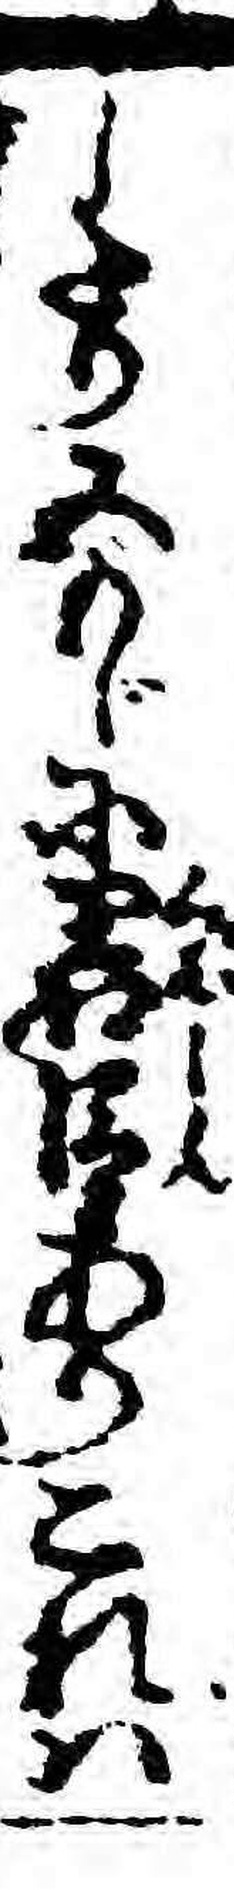したり五もじに君臣ありこれは
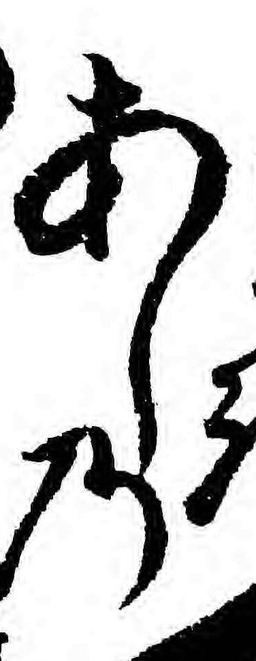あしの
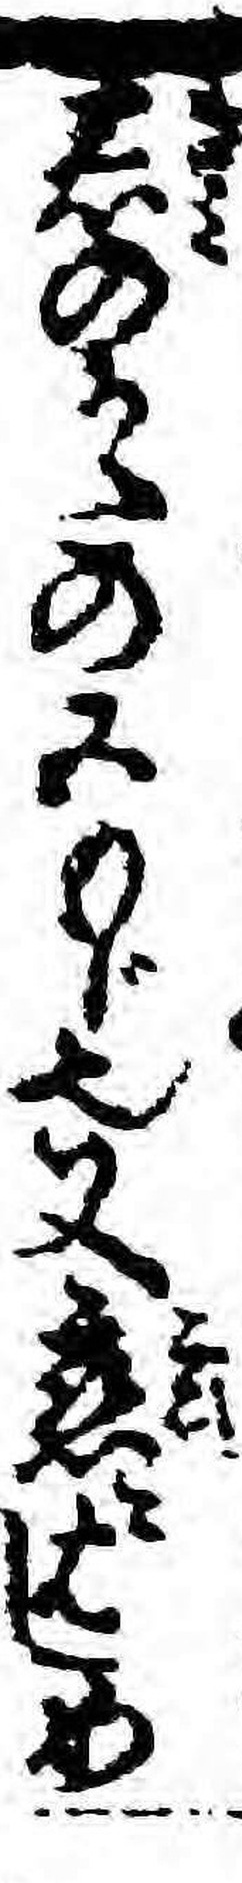君のかたの五もじ也又恋にはしめ
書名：頭書和歌注譯／壽賀多百人一首小倉錦
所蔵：国文学研究資料館
